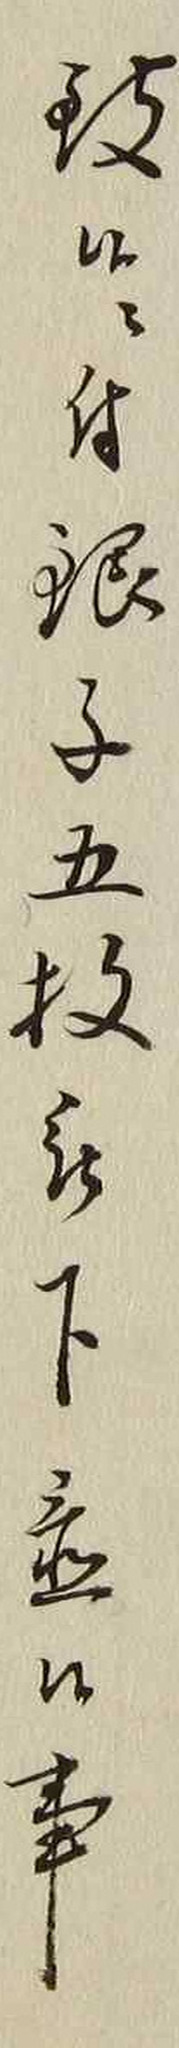致候ニ付銀子五枚被下置候事
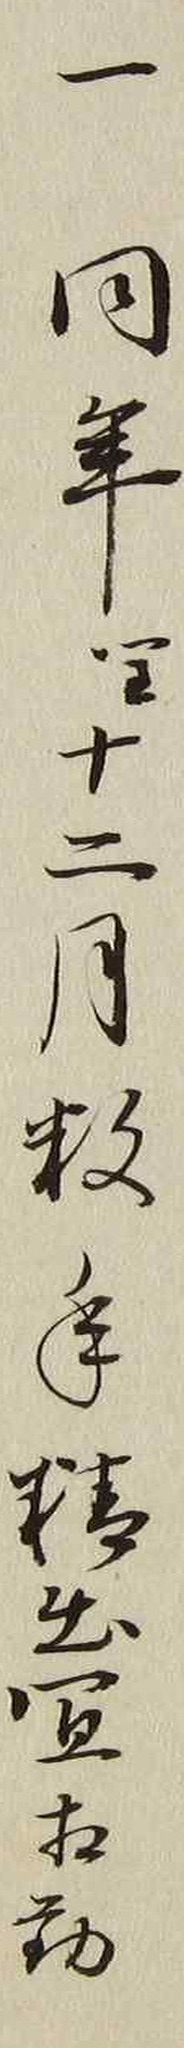一同年閏十二月数年致精出宜相勤
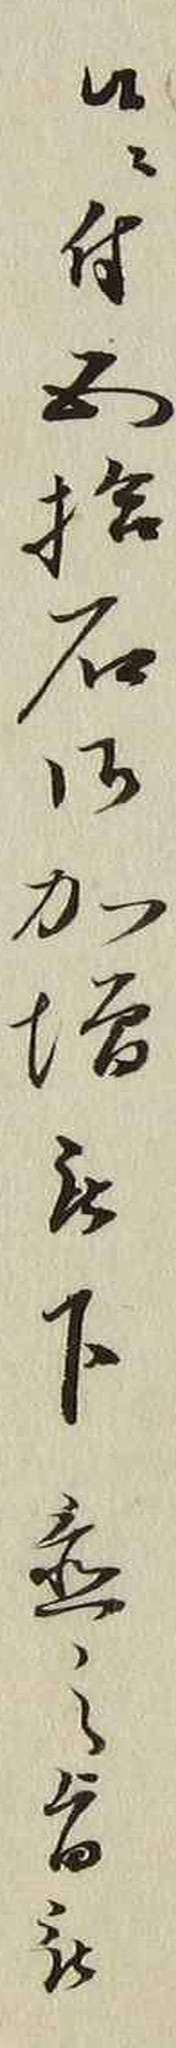候ニ付五拾石御加増被下置之旨被
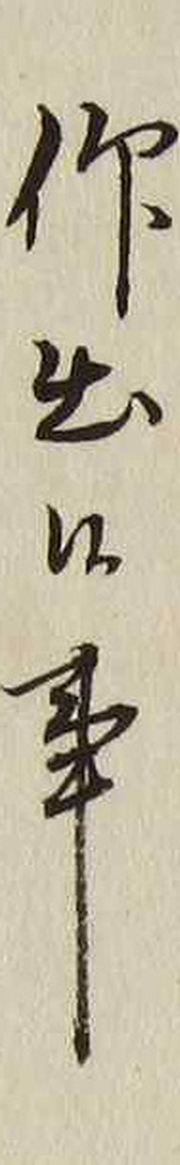仰出候事
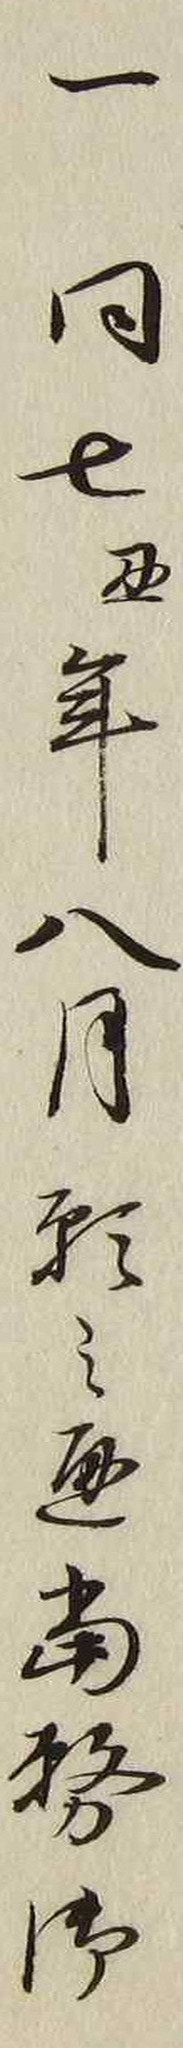一同七丑年八月願之通当務御
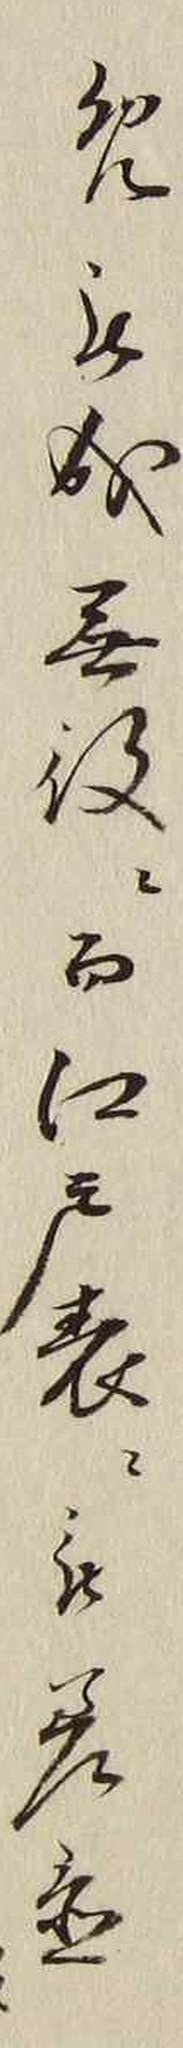免被成無役ニ而江戸表ニ被差置之
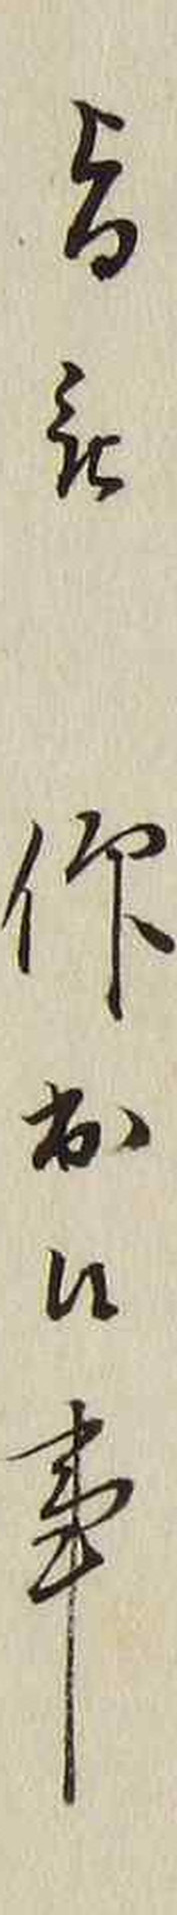旨被仰出候事
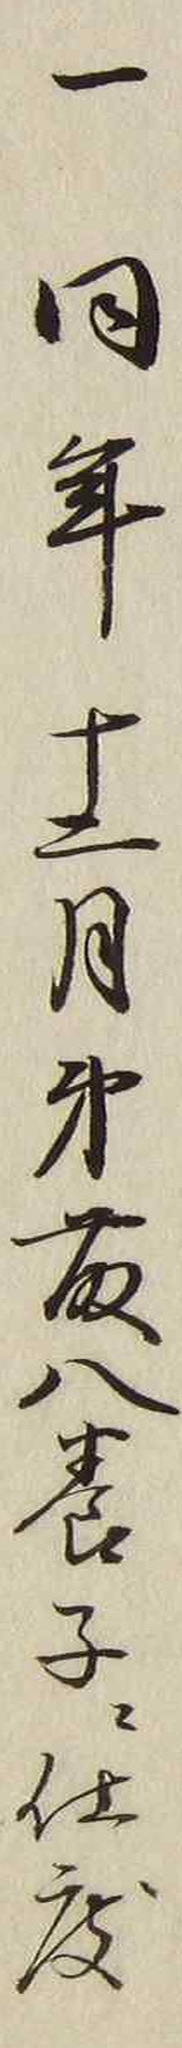一同年十二月弟藤八養子ニ仕度

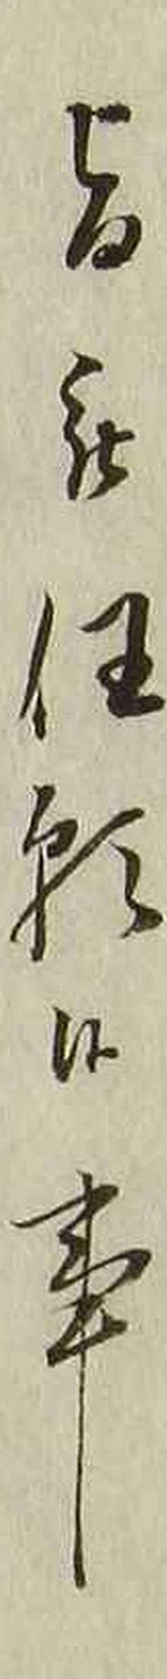旨被任願候事
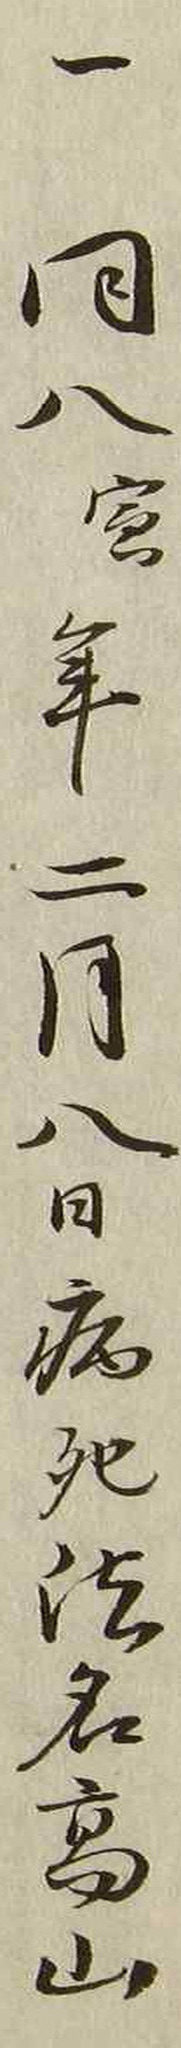一同八寅年二月八日病死法名高山
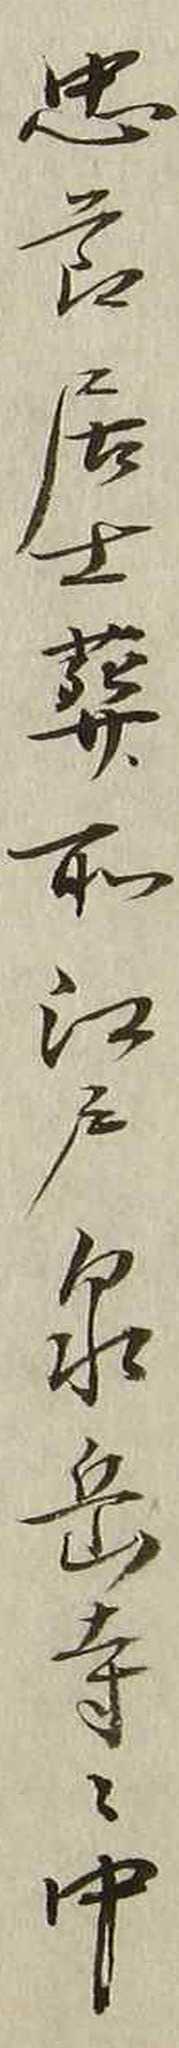忠節居士葬所江戸泉岳寺々中
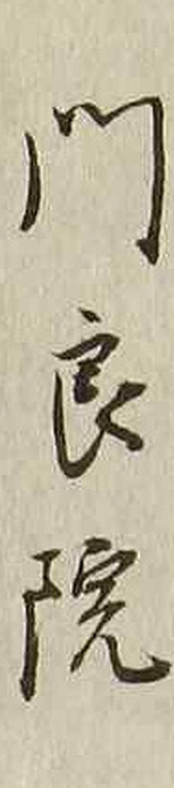門良院
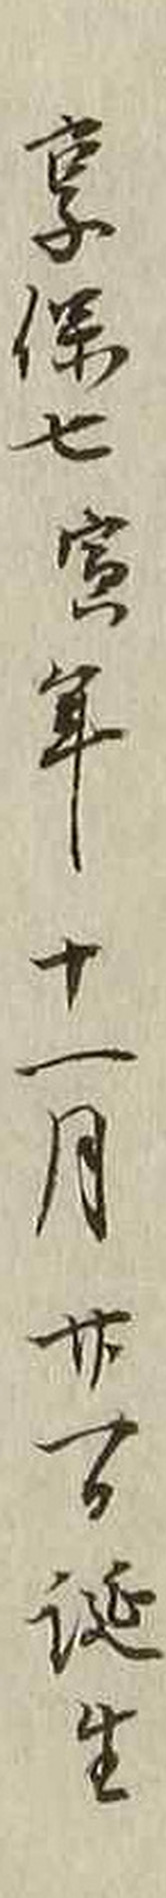享保七寅年十一月廿一日誕生
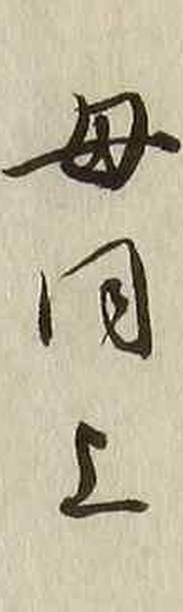母同上
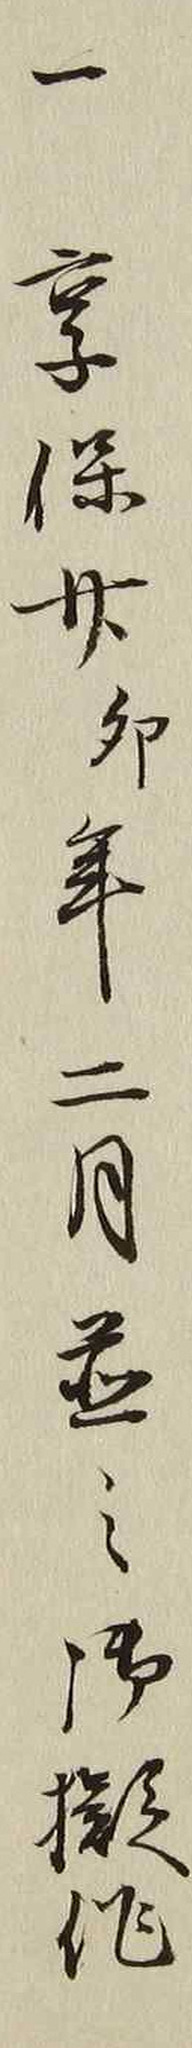一享保廿卯年二月並之御擬作
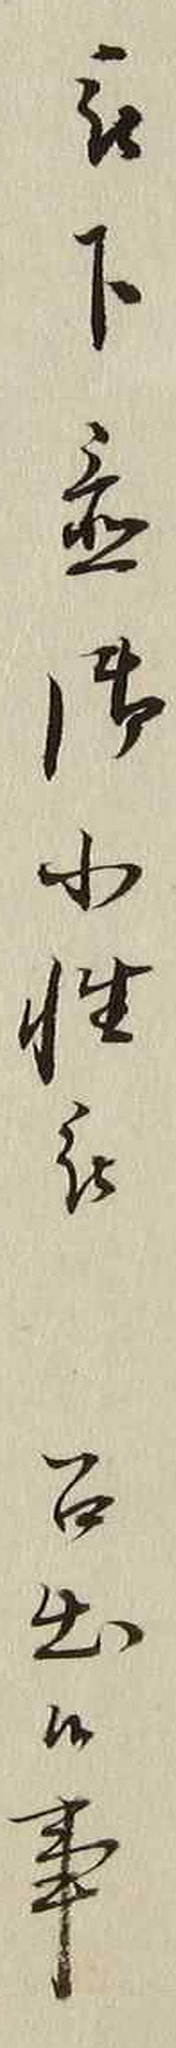被下置御小性被召出候事
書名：諸士系譜　巻之22　い之部22
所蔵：会津若松市立会津図書館
